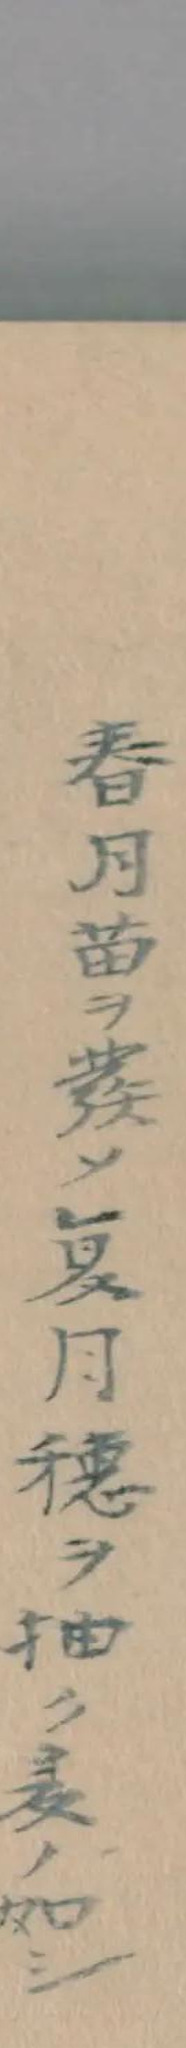春月苗ヲ発シテ复月穂ヲ抻ク麦ノ如シ
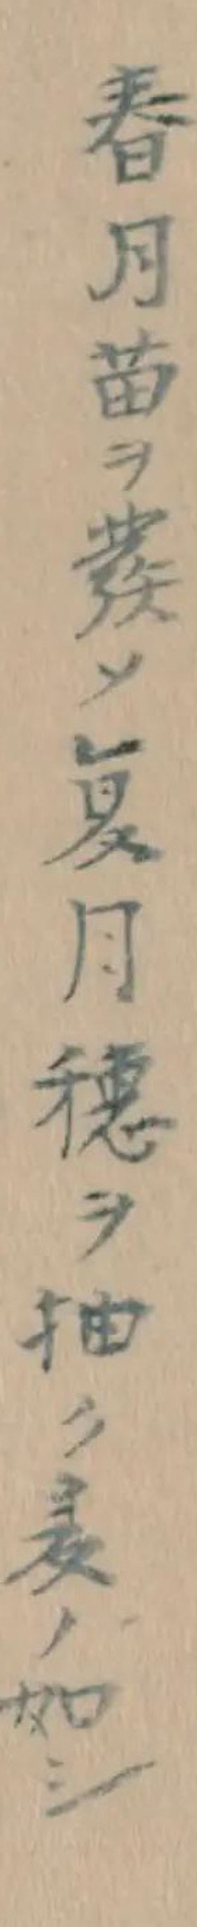春月苗ヲ発シテ复月穂ヲ抻ク麦ノ如シ
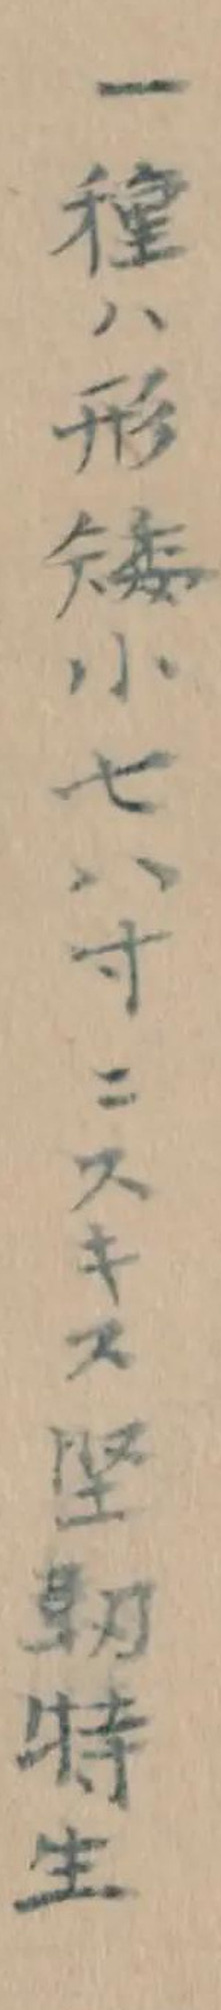一種ハ形矮小七八寸ニスキス堅靭特生
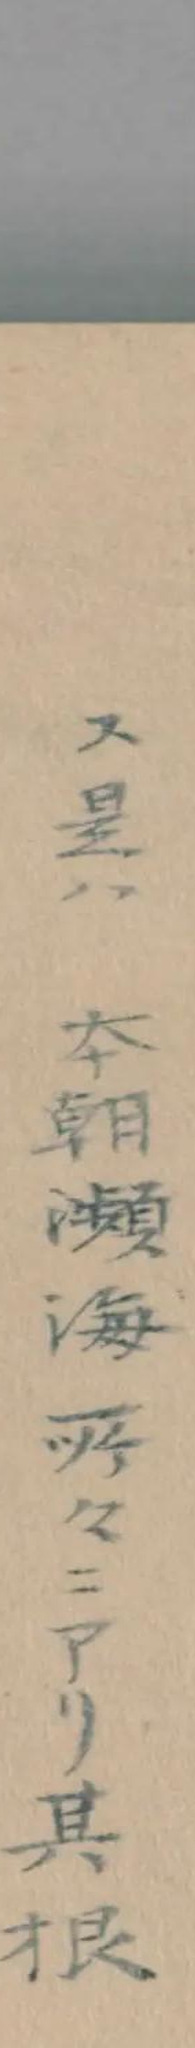ス是ハ本朝瀬海所々ニアリ其根
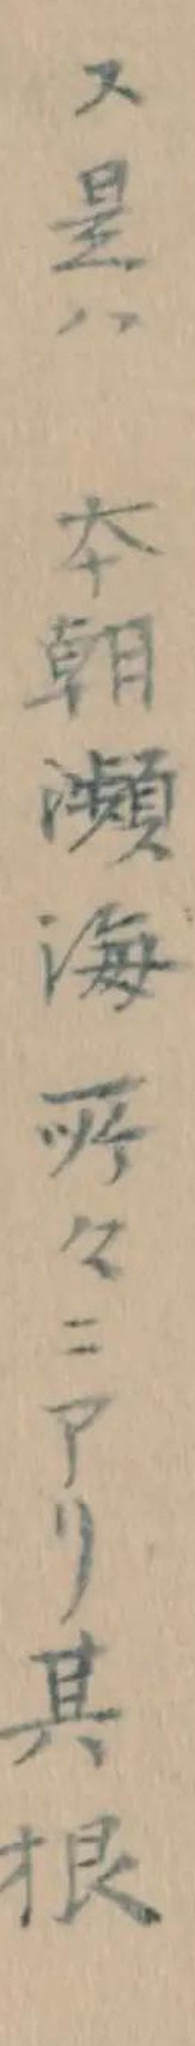ス是ハ本朝瀬海所々ニアリ其根
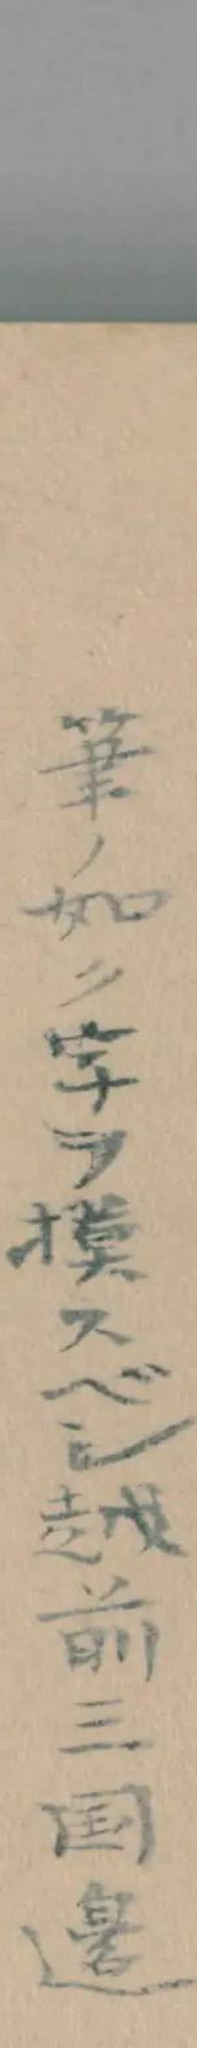筆ノ如ク字ヲ模スベシ越前三国辺
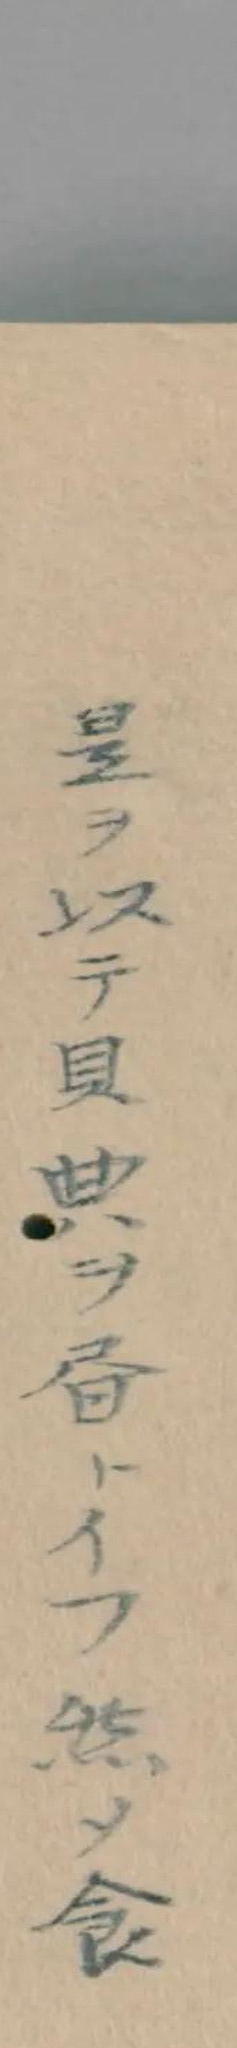是ヲ以テ貝典ヲ書トイフ然シテ食
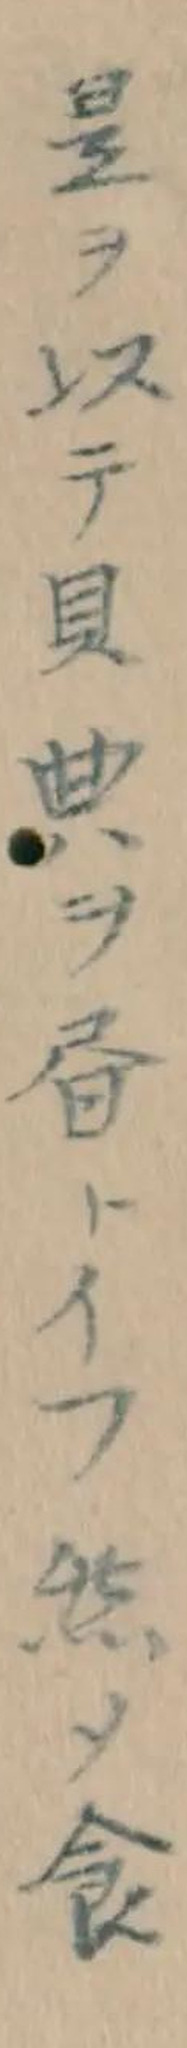是ヲ以テ貝典ヲ書トイフ然シテ食

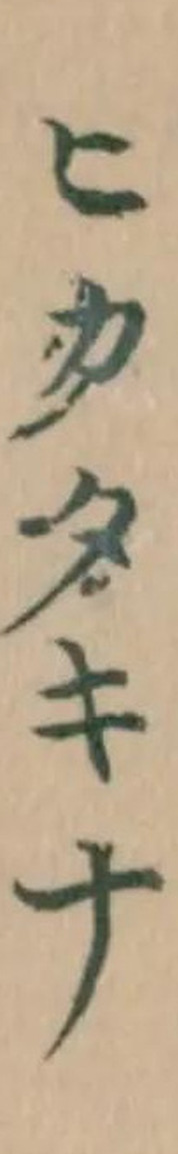ヒカタキナ
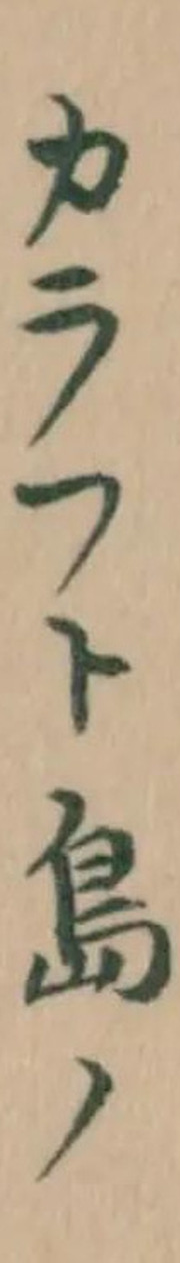カラフト島ノ
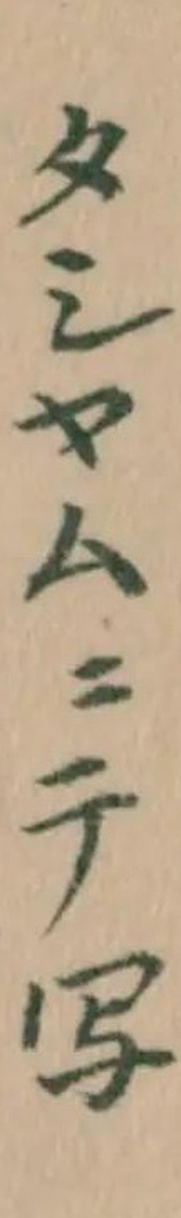タシヤムニテ写
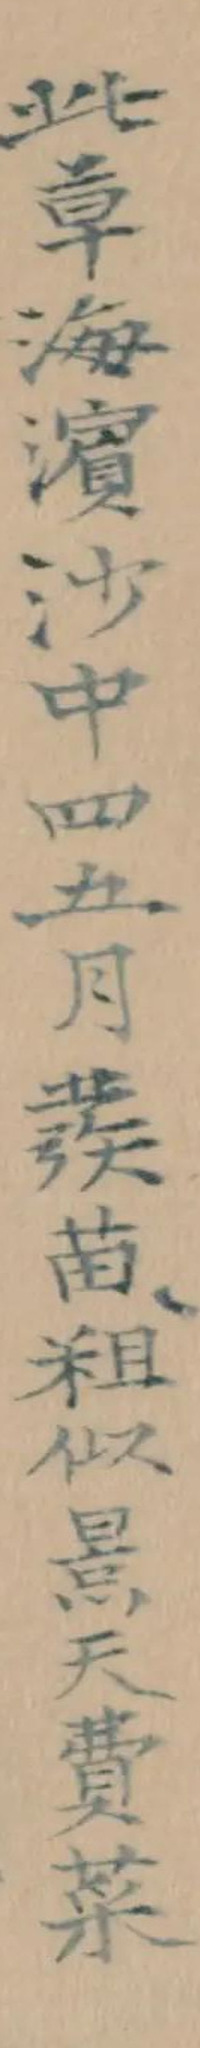此草海浜沙中四五月発苗、粗以景天費菜
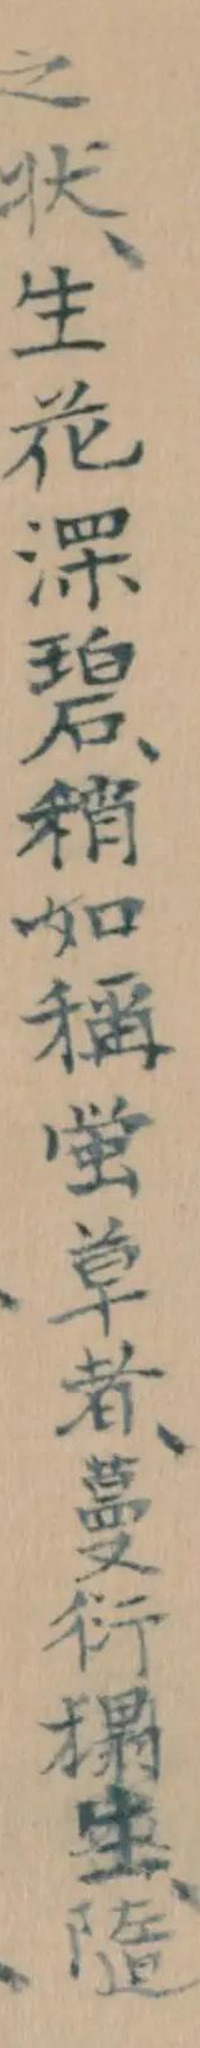之状、生花深緑稍如称蛍草者、蔓衍榻生、隨
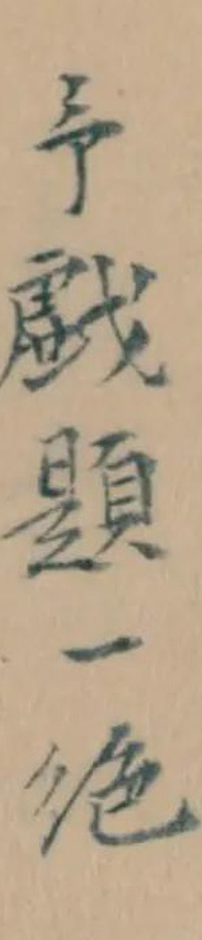予戯題一絶
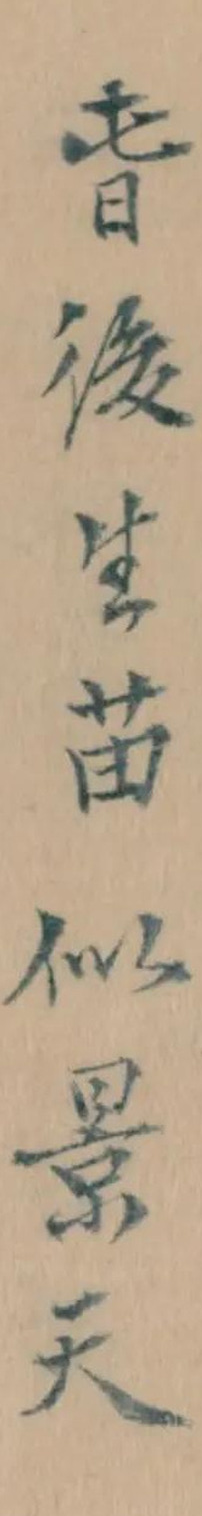旾後生苗以景天
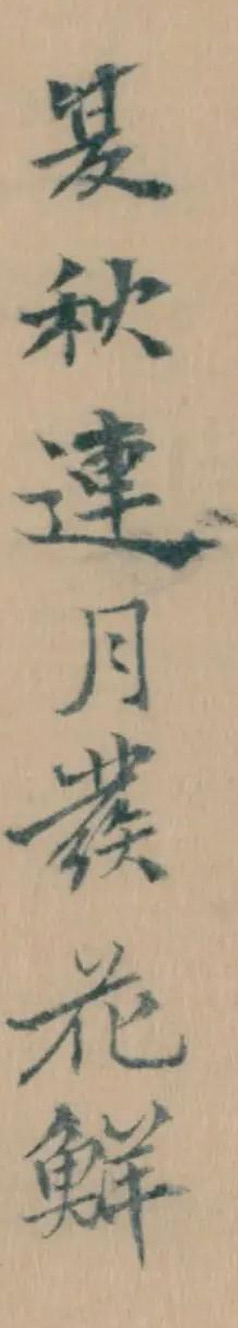复秋連月発？花鮮
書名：蝦夷草木図
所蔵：国立国会図書館 National Diet Library, JAPAN
